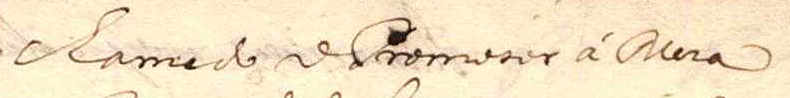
chamado o Promotor á Meza
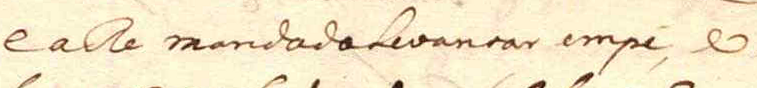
e a Re mandada Levantar em pe, e
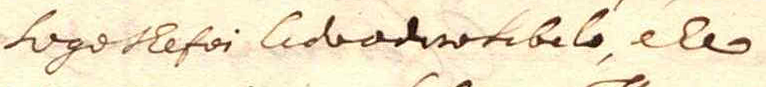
logo lhe foi lido o dito libelo, e he
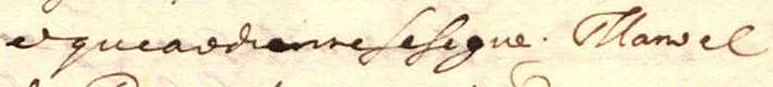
o que aodiante se segue. Manoel
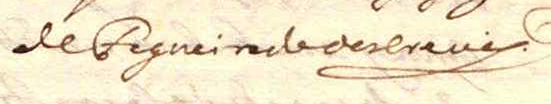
de Fegueiredo o escreuy.
